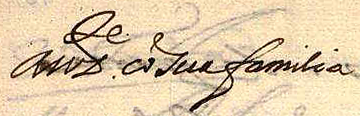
auz.te cō sua familia
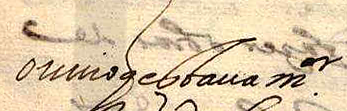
ouuio q̄ estaua mor
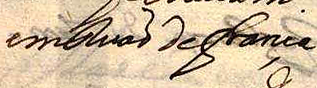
em Ruaõ de frança
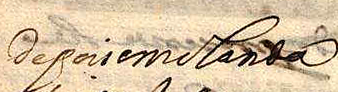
depois em olanda
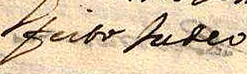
feito Judeo
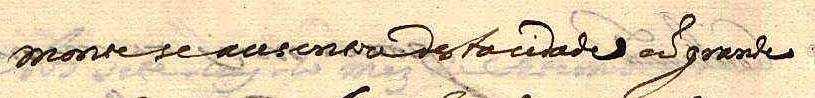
monte se ausentou desta cidade cō grande
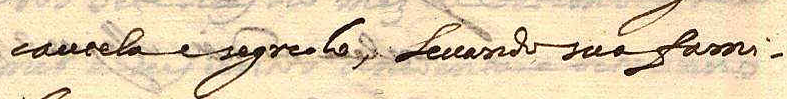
cautela e segredo, Leuando sua fami
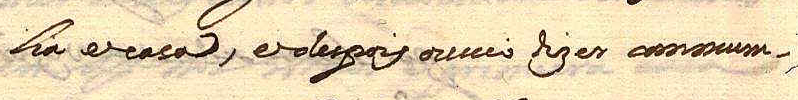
lia e caza, e despois ouuio dizer commum
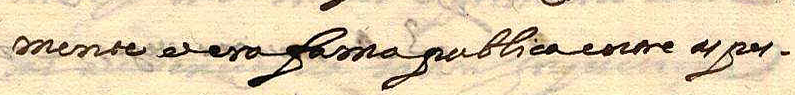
mente e era fama publica entre as pes
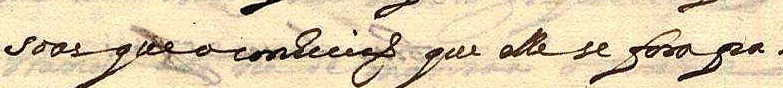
soas que o conheciaõ que elle se fora pa
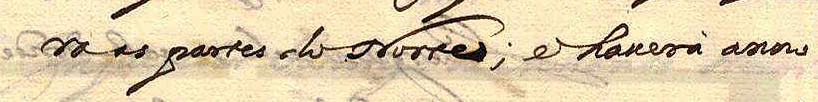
ra as partes do Norte; e hauera anno
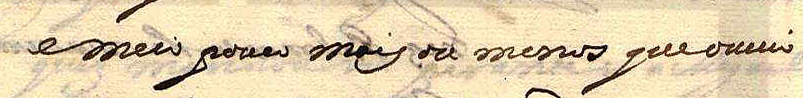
e meio pouco mais ou menos que ouuio
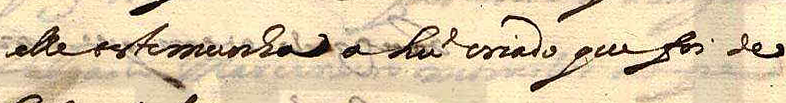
elle testemunha a hū criado que foi de
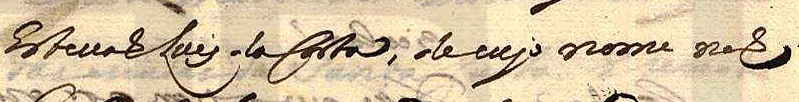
Esteuaõ Luis da Costa, de cujo nome naõ
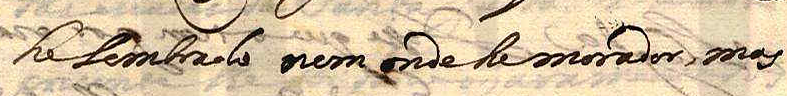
he lembrado nem onde he morador, mas
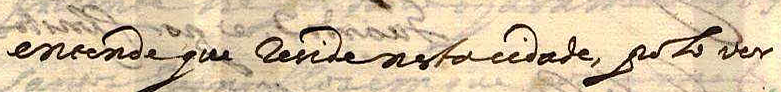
entende que Reside nesta cidade, polo ver
